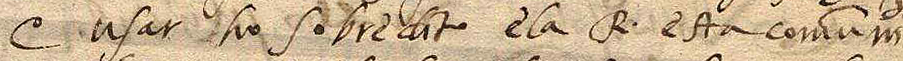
e usar ho sobredito ela R. esta comūmte
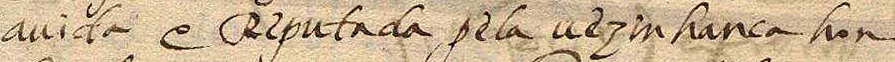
auida e Reputada pela uezinhanca hon
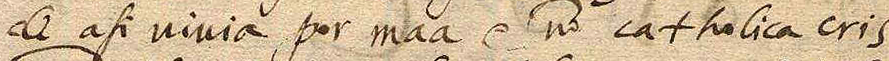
de asi uiuia por maa e nō catholica cris
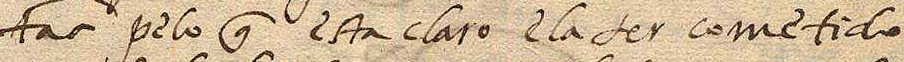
taã pelo q̅ esta claro ela ter cometido
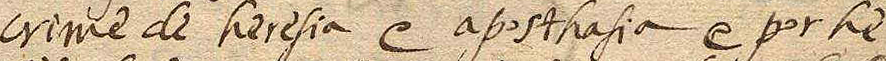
crime de heresia e aposthasia e por he
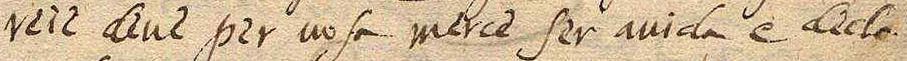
reie deue per uosa merce ser auida e decla
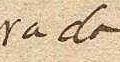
rada
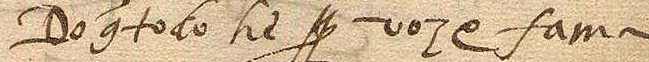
Do q̅ todo he ꝓꝓca voz e fama
